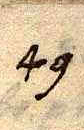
49
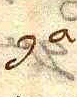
3a
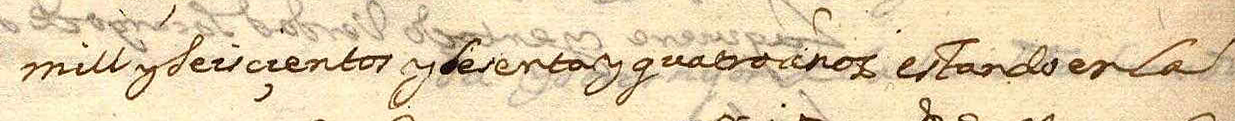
mill e seiscientos y sesenta y quatro an̄os estando en la
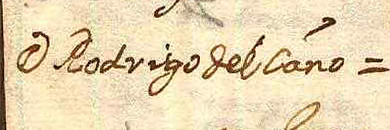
E Rodrigo del Can̄o
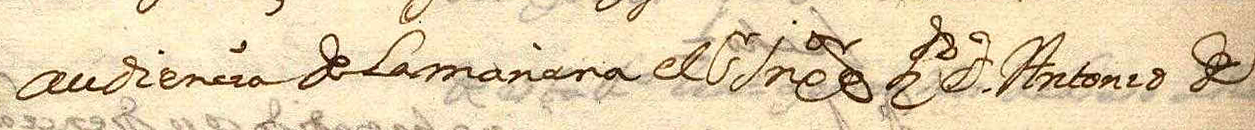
audiencia de la man̄ana el sr Inqor Ldo D. Antonio de
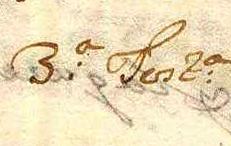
3.a Test.a
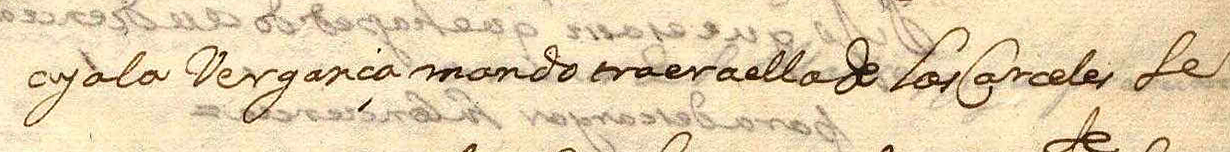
ayala Vergança, mando traer a ella de las Carceles se
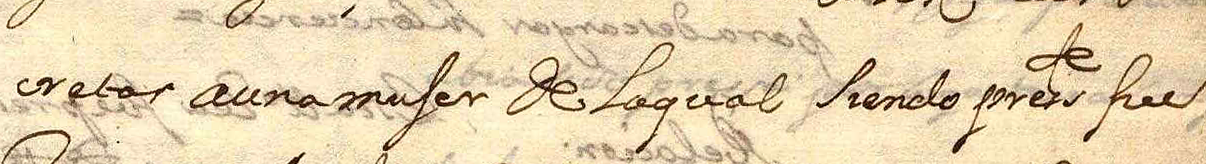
cretas a una muJer de La qual siendo preste fue
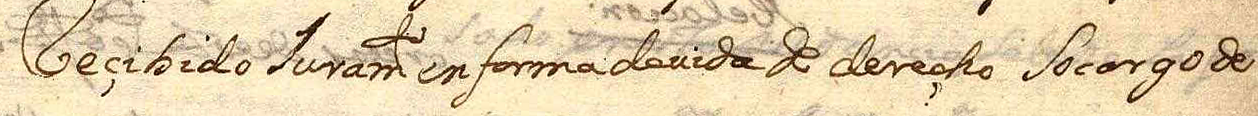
Recibido Iuramto en forma deuida de derecho so cargo de
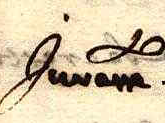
Juramto
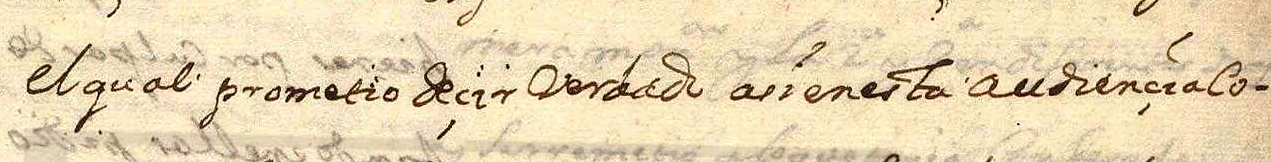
el qual prometio decir verdad asi en esta audiencia co
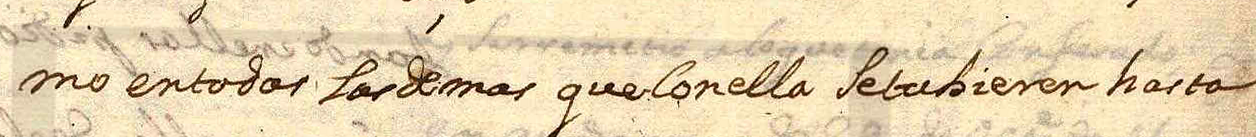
mo en todas las demas que con ella se tubieren hasta
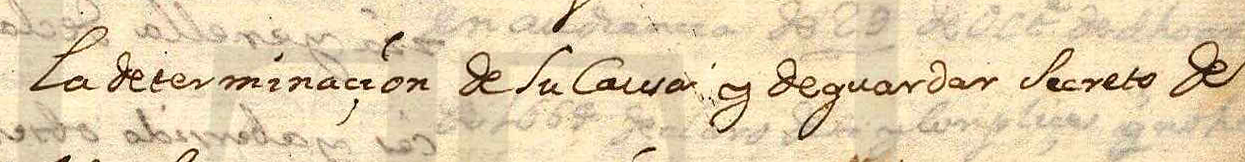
la determinacion de su Causa y de guardar secreto de
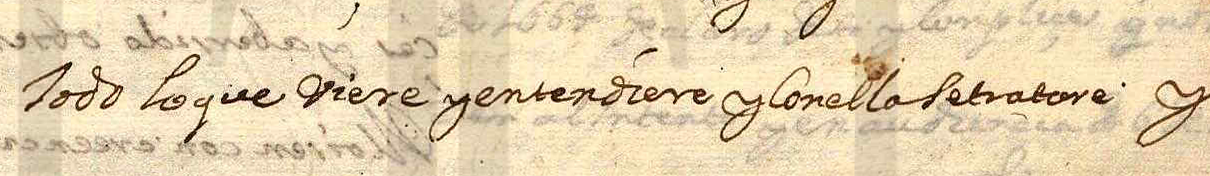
todo o que viere y entendiere y con ella se tratare y
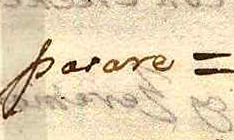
pasare
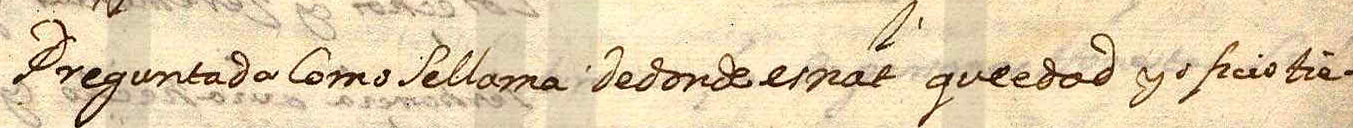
Preguntada Como se llama de donde es natl que edad y oficio tie
